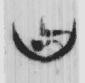曰
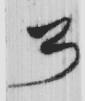乃
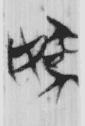{女㐬}
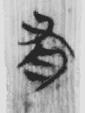有
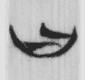曰
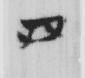四
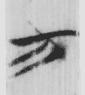方
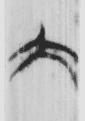大
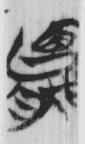{𣎆角}
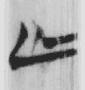亡
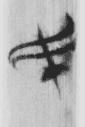民
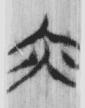亦
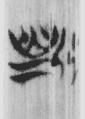斯
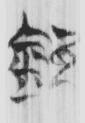欽
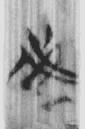我
